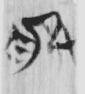服
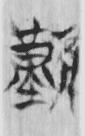難
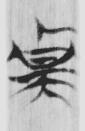{真天}（祗）
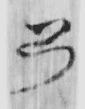乃
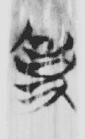事
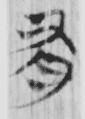有
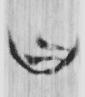曰
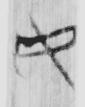女
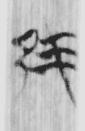隹
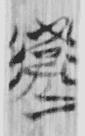{衛止}
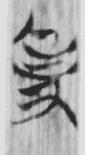事
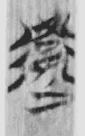{衛止}
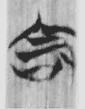命
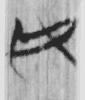女
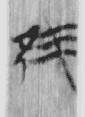隹
